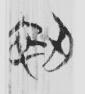初
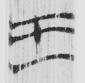王
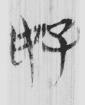好
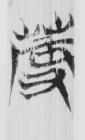蓐
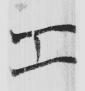工
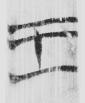王
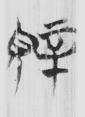親
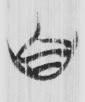自
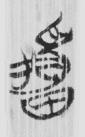{井田力}
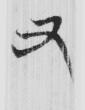又
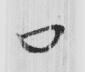厶
